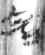爲
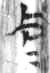下上
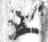之
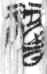禱
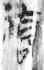○（祠）
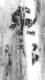○（鬼）
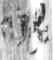神
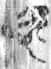卿（饗）
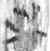之
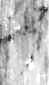乃
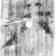亓（其）
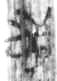志
